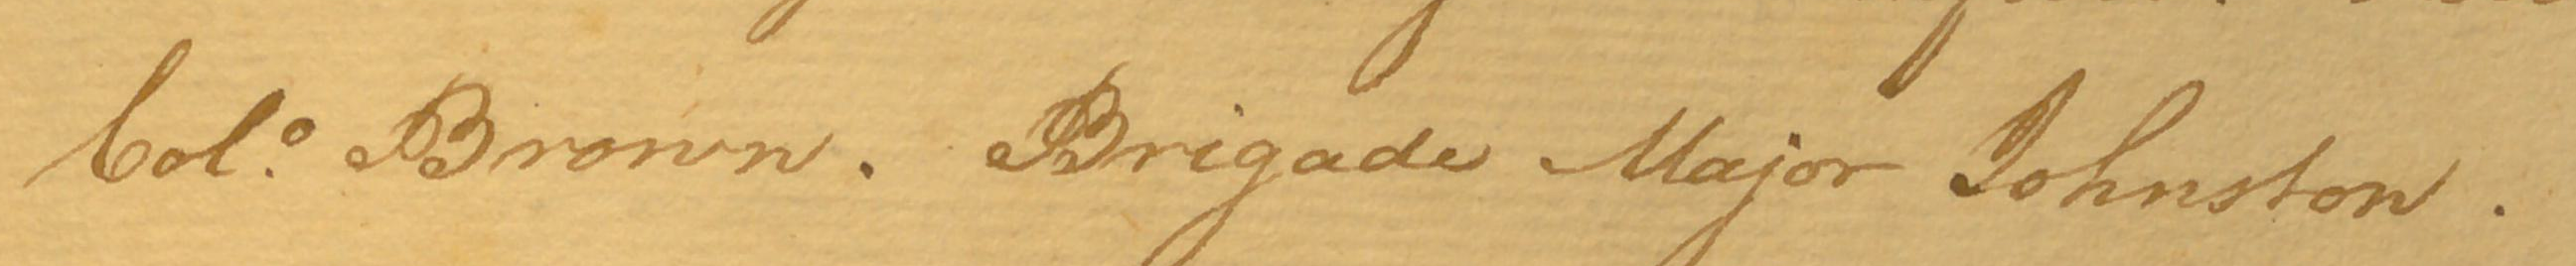Col^o. Brown. Brigade Major Johnston.
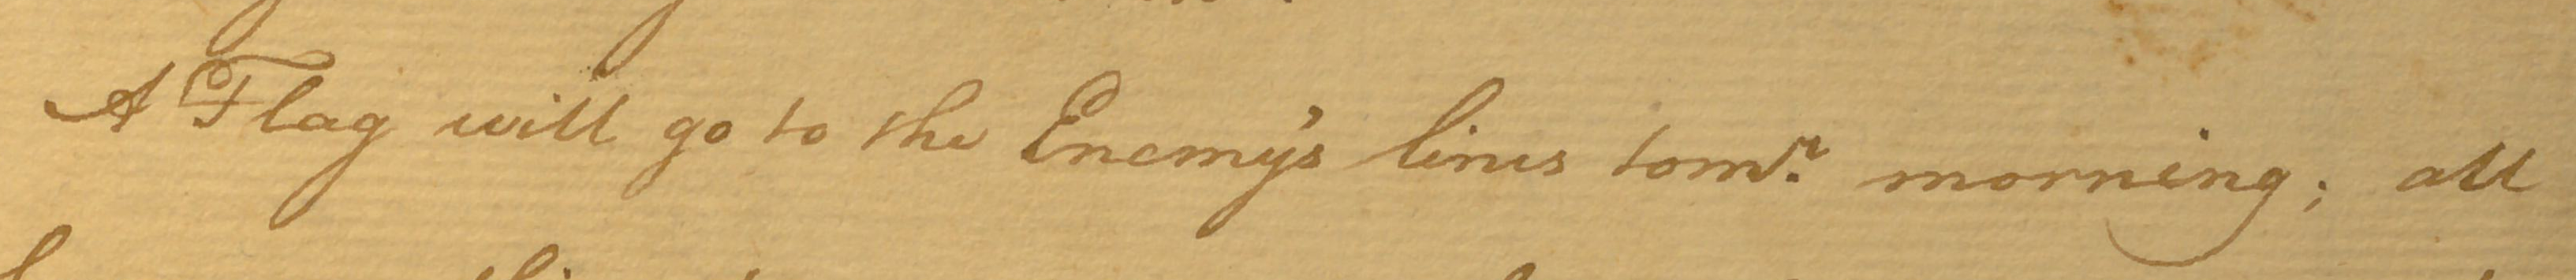A Flag will go to the Enemy's lines tom^r. morning; all
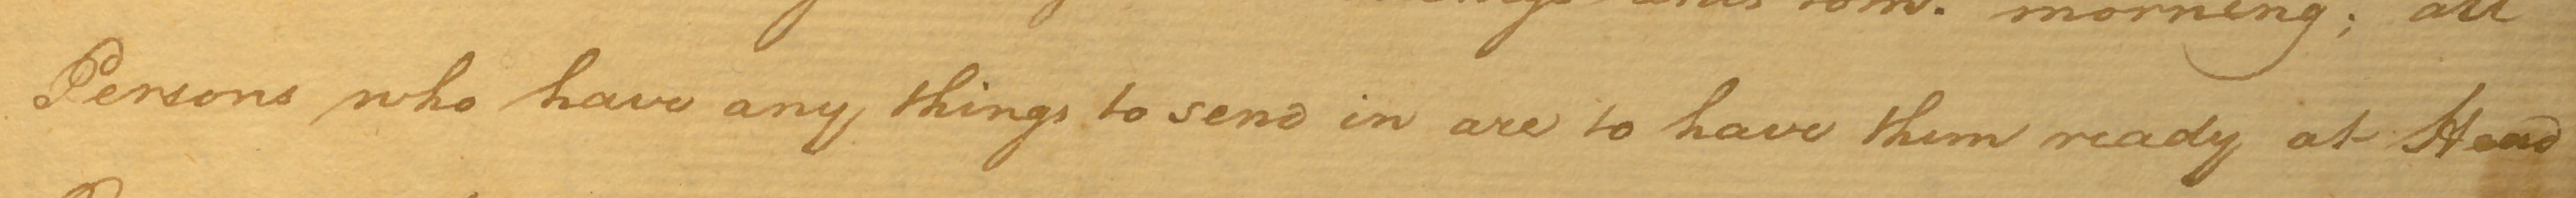Persons who have any things to send in are to have them ready at Hand
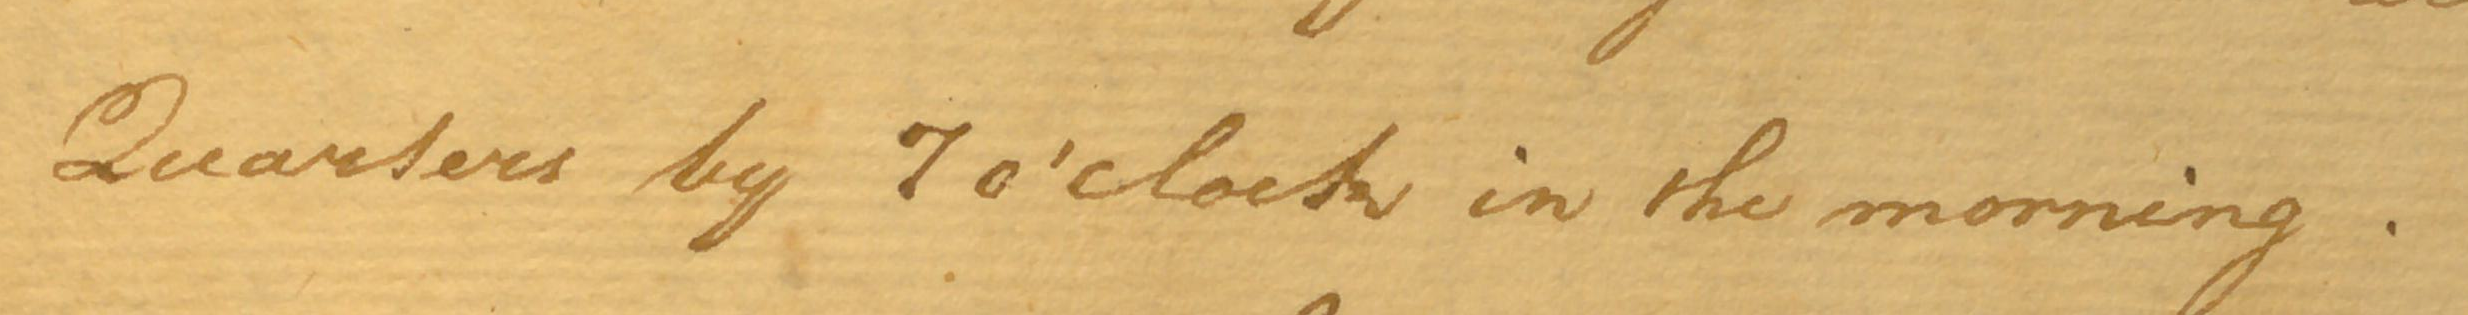Quarters by 7 o'clock in the morning.
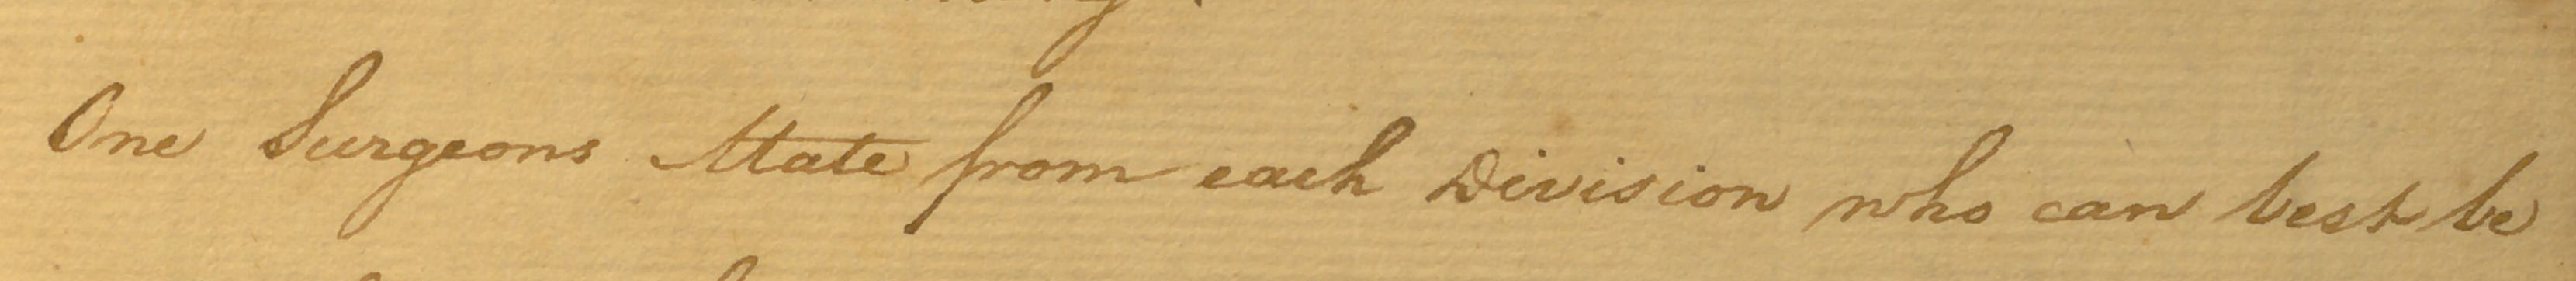One Surgeons State from each Division who can best be
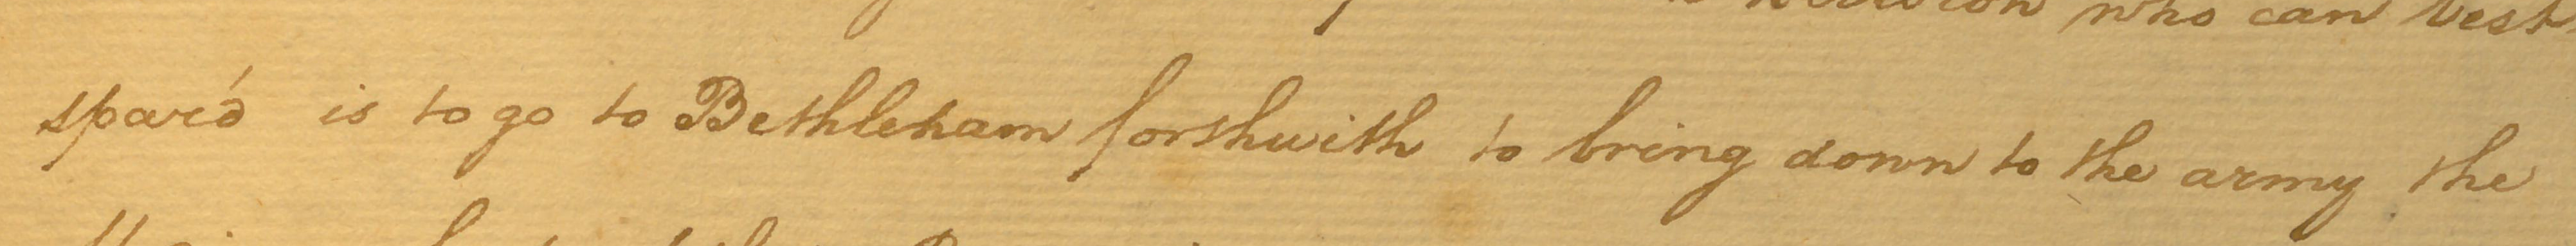spar'd is to go to Bethleham forthwith to bring down to the army the
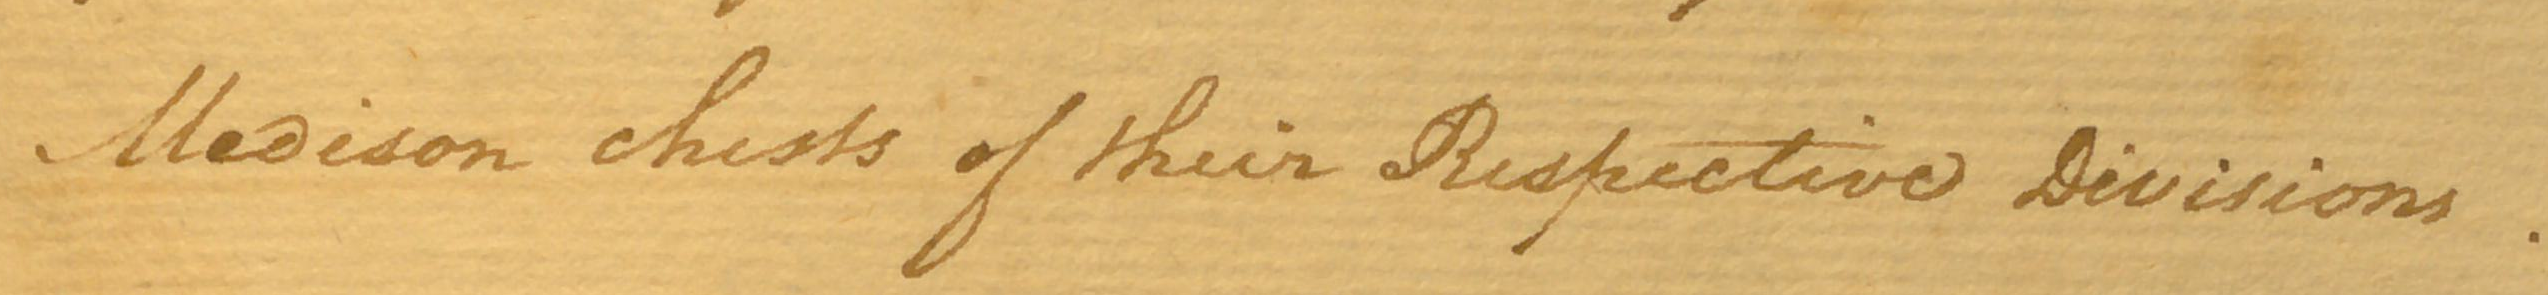Medison chests of their Respective Divisions
